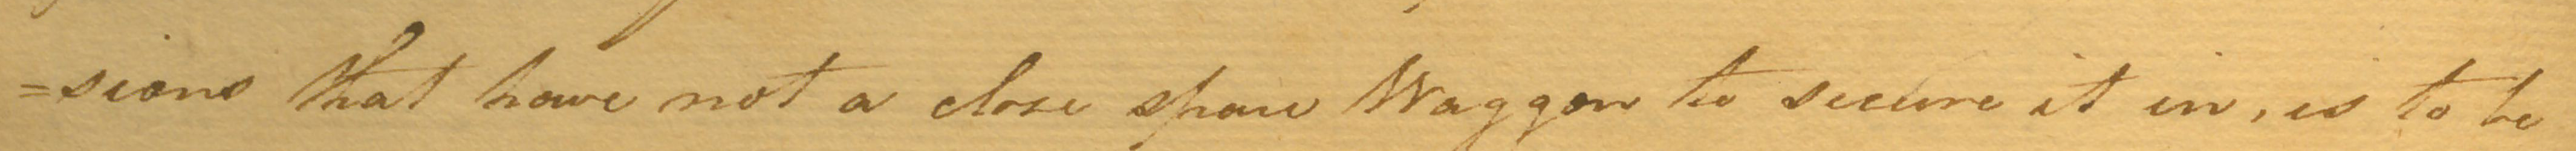-sions that have not a close spare Waggon to secure it in, is to be
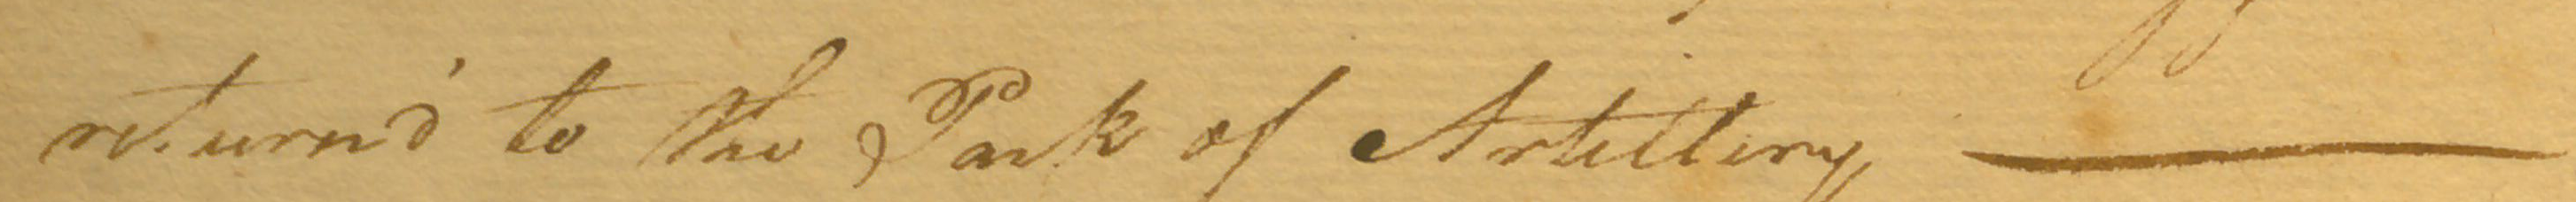return'd to the Park of Artillery-
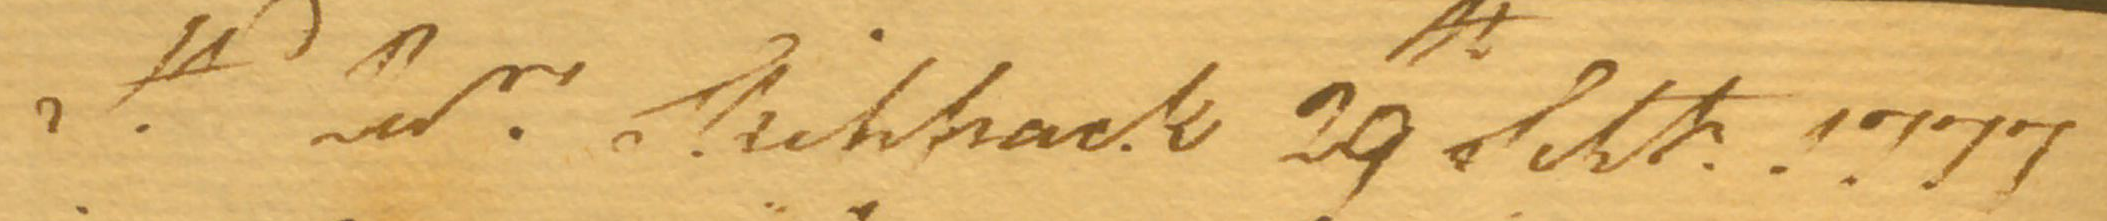H^d. Qu^rs. Skippack 29^th Sept^r. 1777
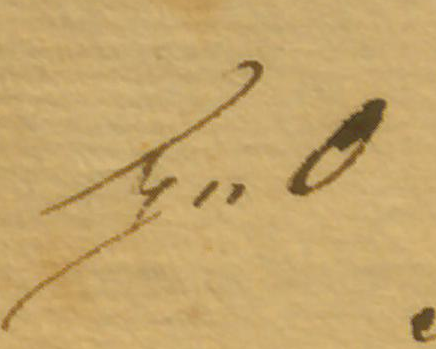G.O
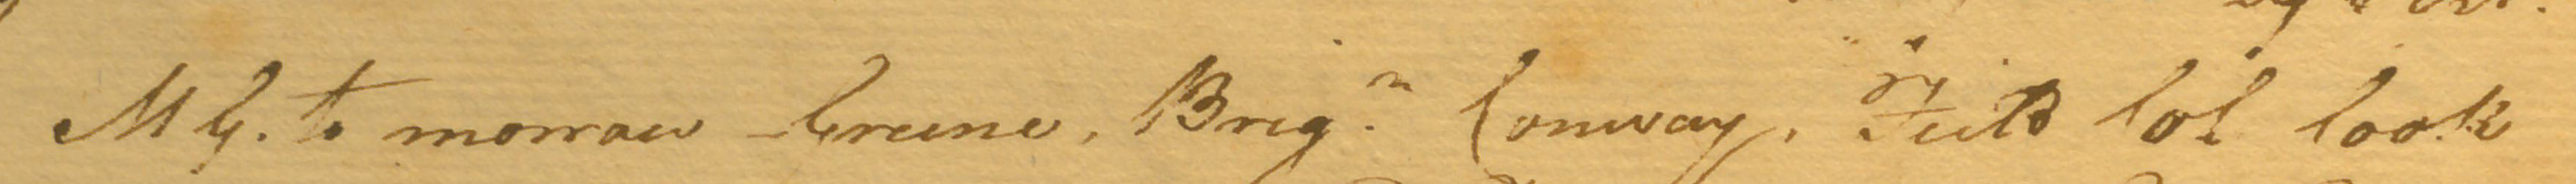MG. to morrow- Greene, Brig^r. Conway. Field Col Cook
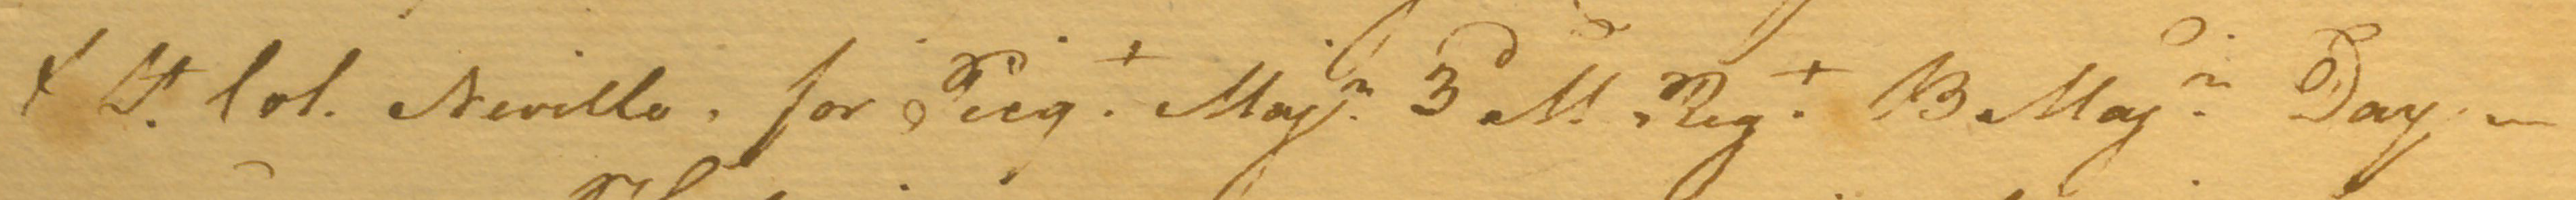& L^t. Col. Neville, for Picq^t. Maj^r. 3^d. M. Reg^t. B Maj^r. Day-
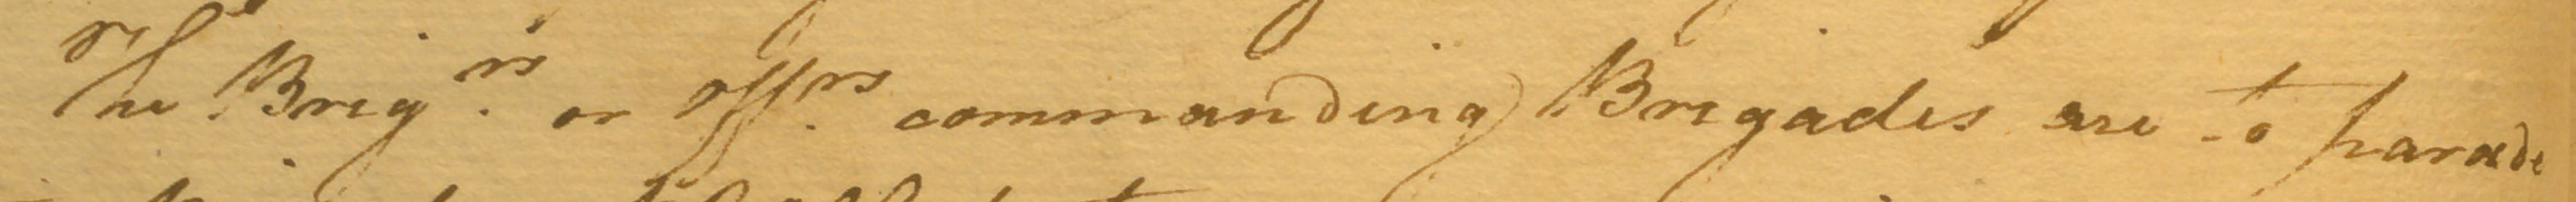The Brig^rs. or Off^rs. commanding Brigades are to parade
